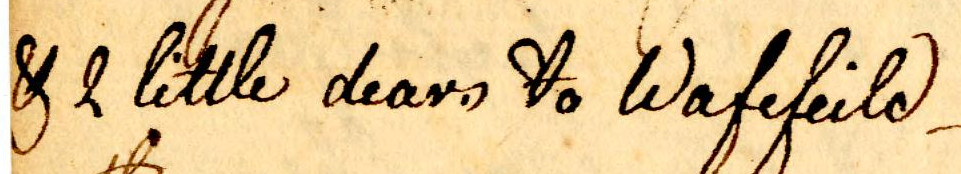& 2 little dears to Wafefeild
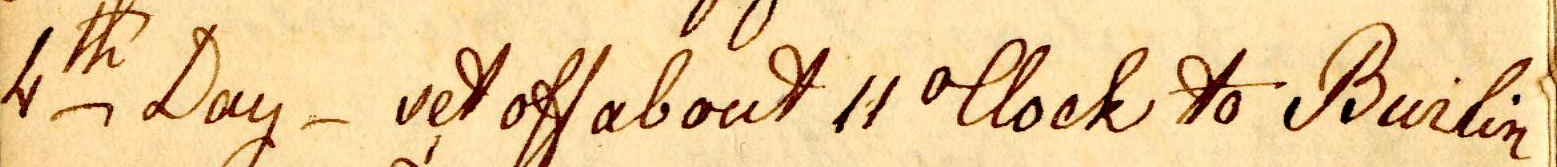4^th Day- set off about 11 oClock to Burlin
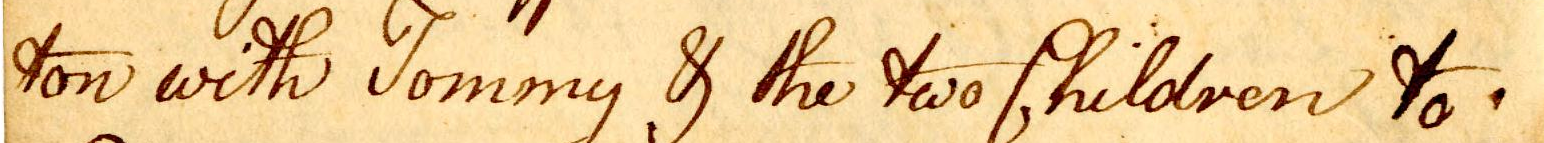ton with Tommy & the two Children to
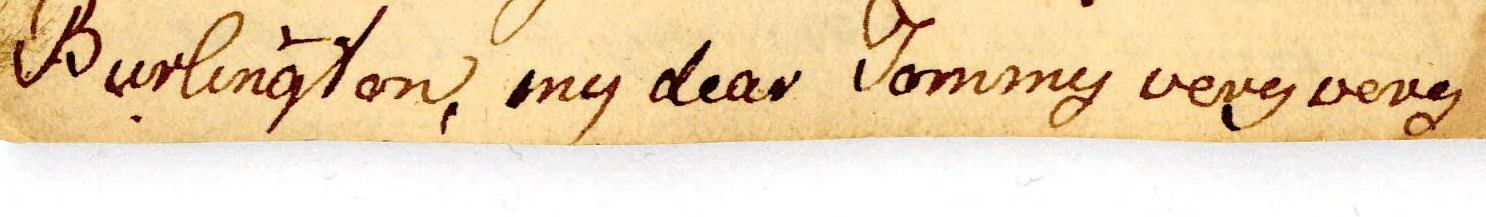Burlington, my dear Tommy very very
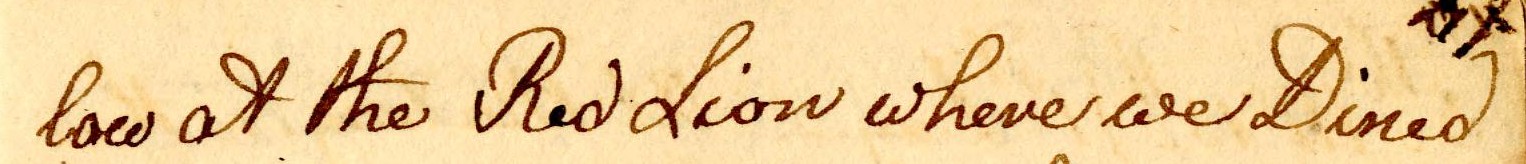low at the Red Lion where we Dined
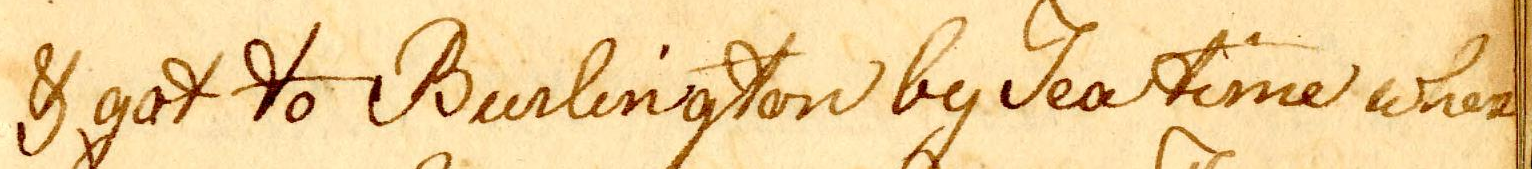& got to Burlington by Tea time when
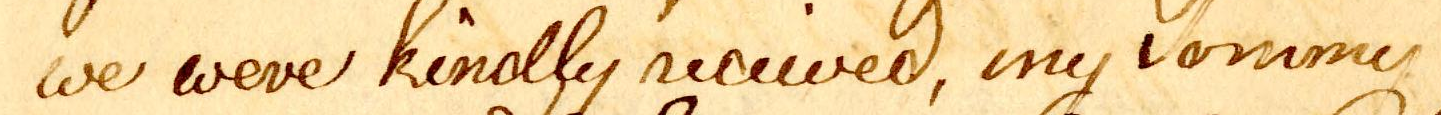we were kindly received, my Tommy
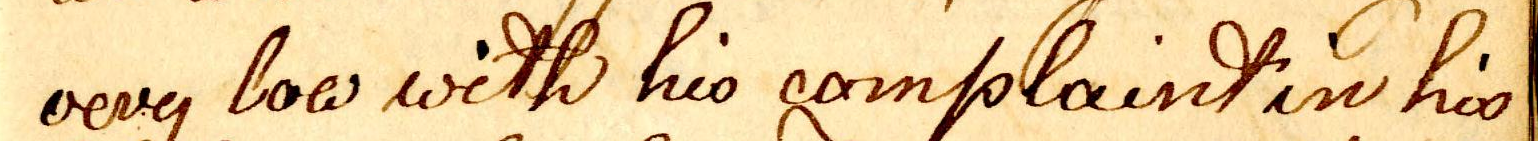very low with his complaint in his
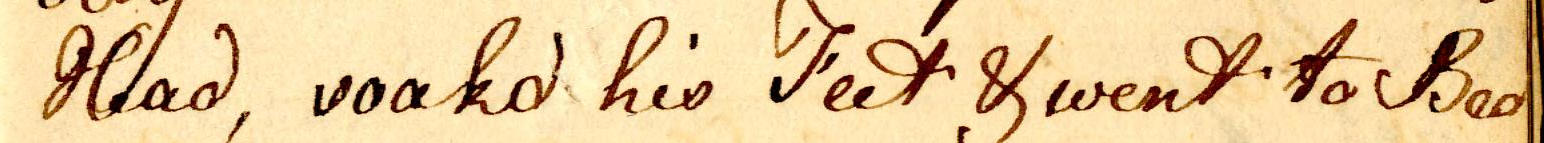Head, soakd his Feet & went to Bed
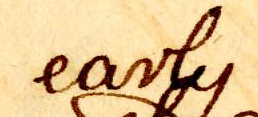early
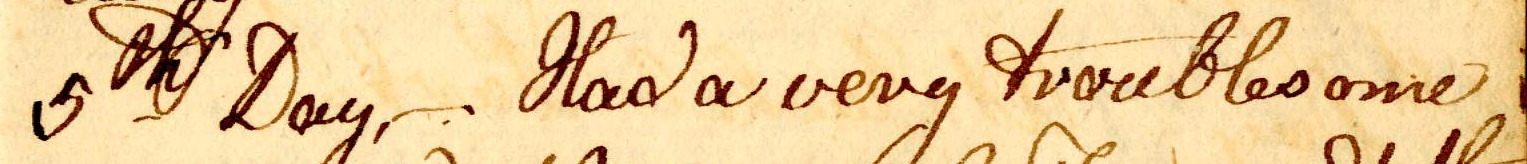5^th Day- Had a very troublesome
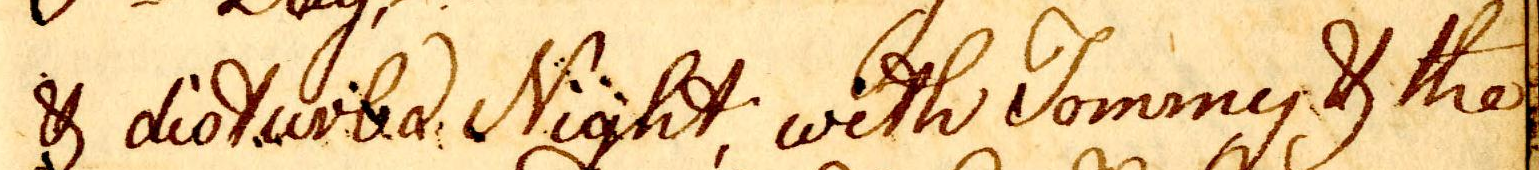& disturbd Night, with Tommy & the
